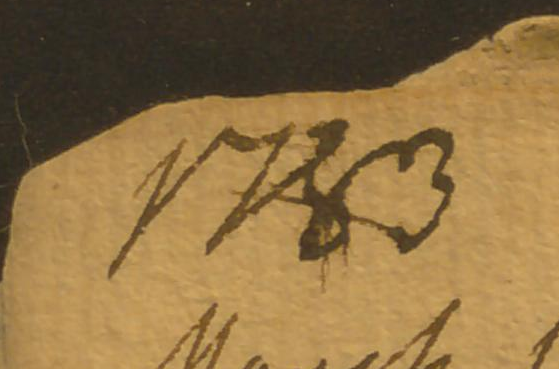1783
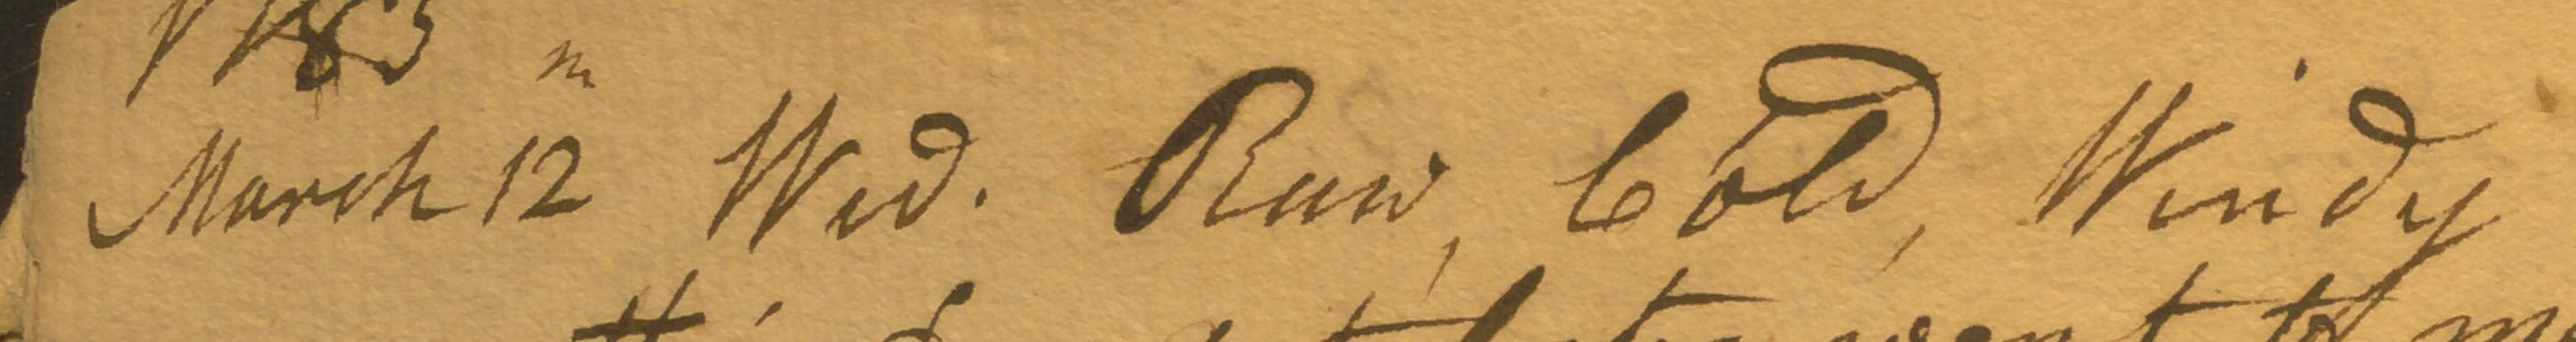March 12^th Wed. Raw, Cold, Windy
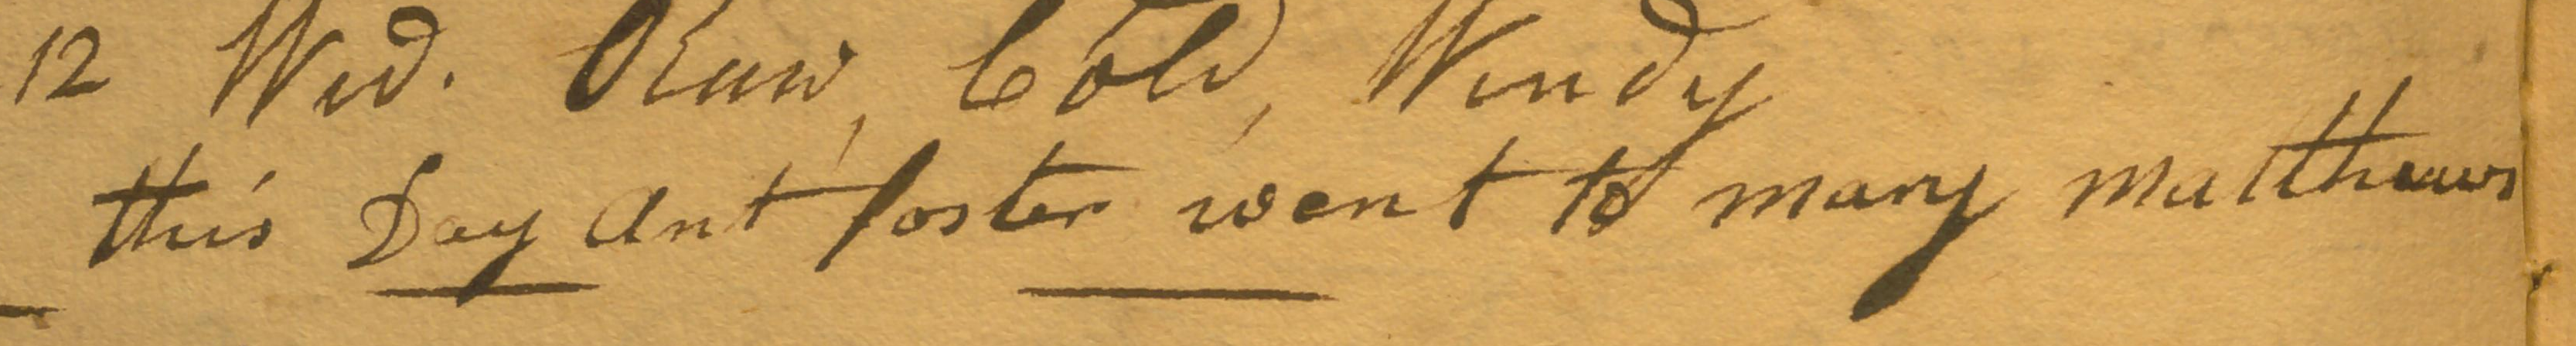this Day Ant foster went to mary matthews
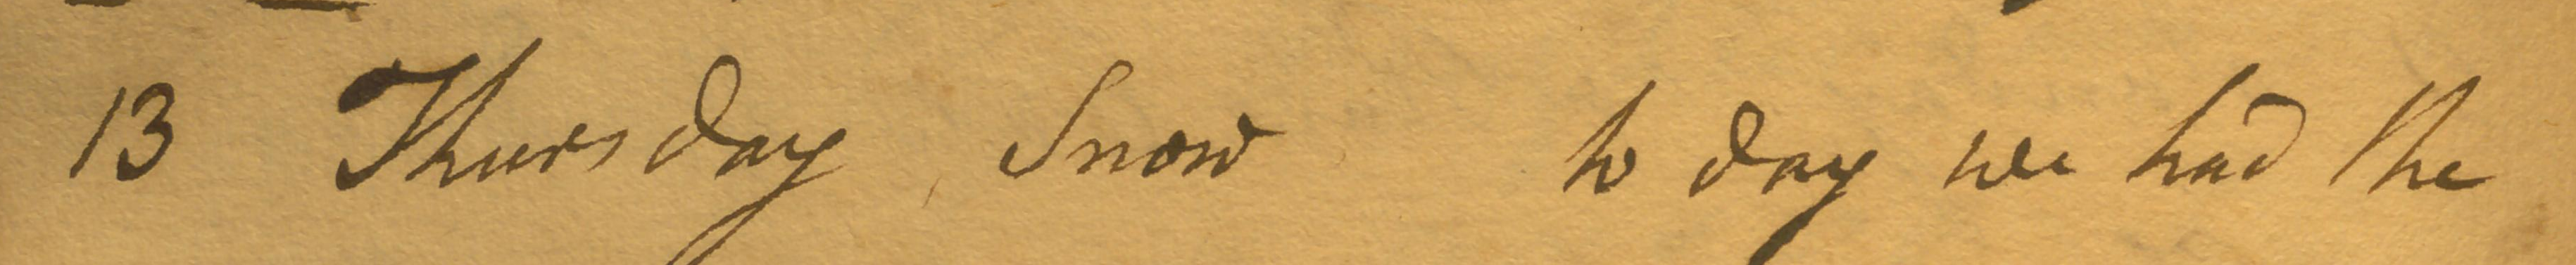13 Thursday Snow to day we had the
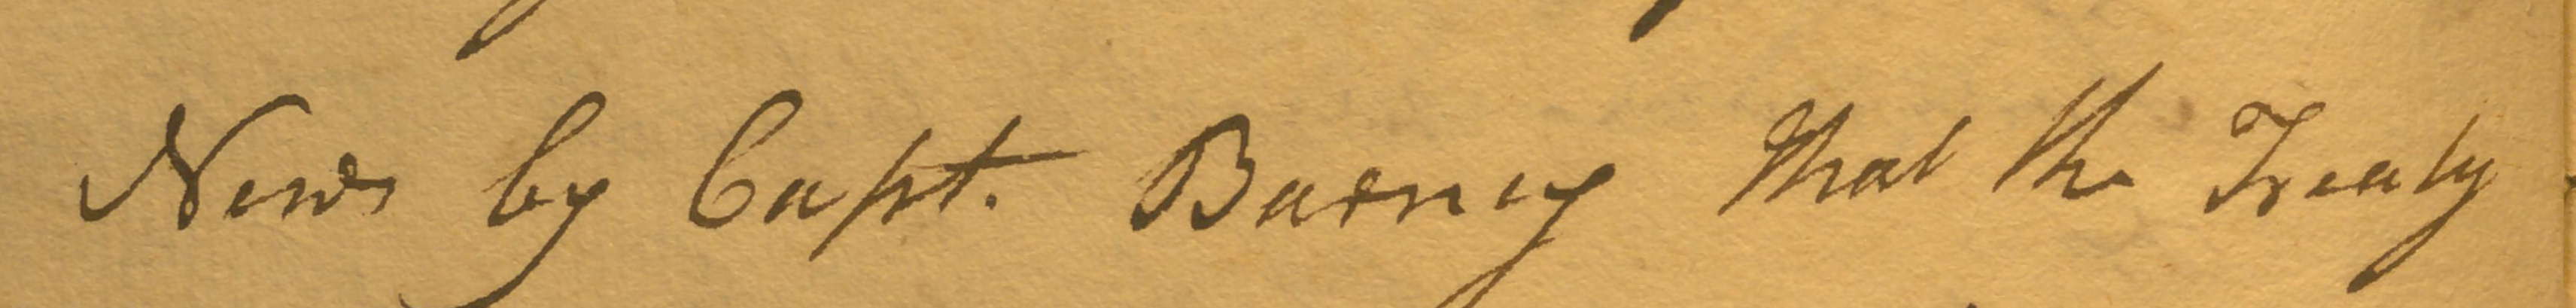News by Capt. Barney that the Treaty
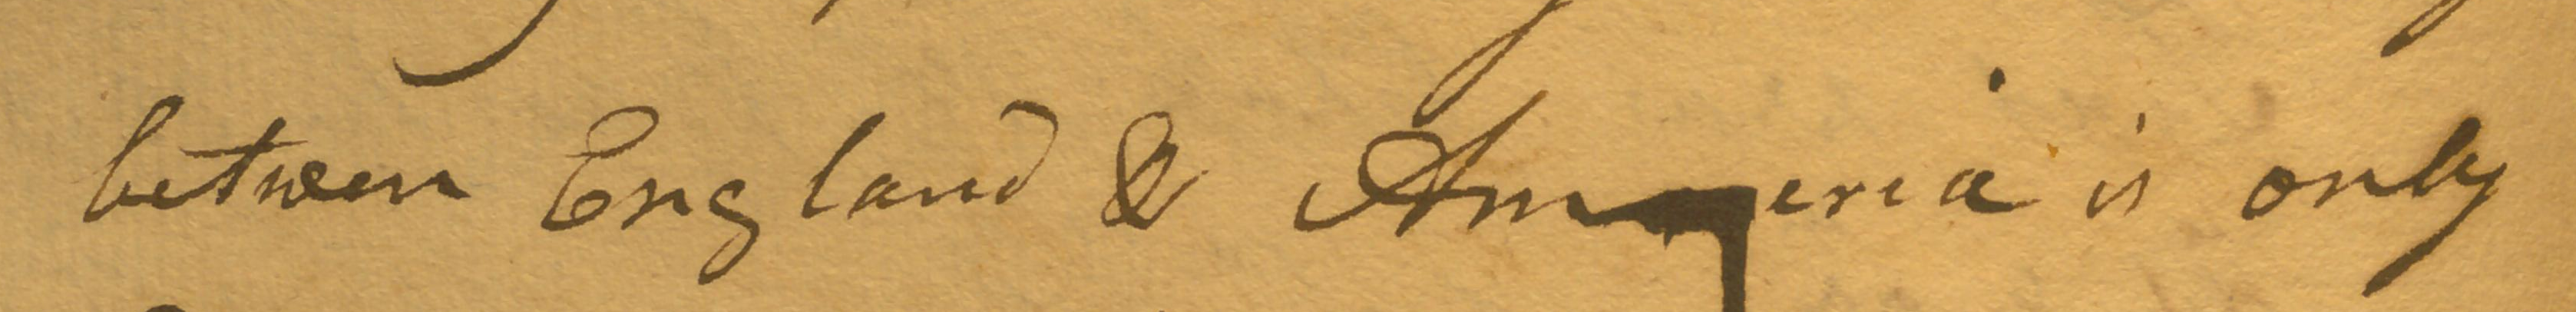betwen England & America is only
